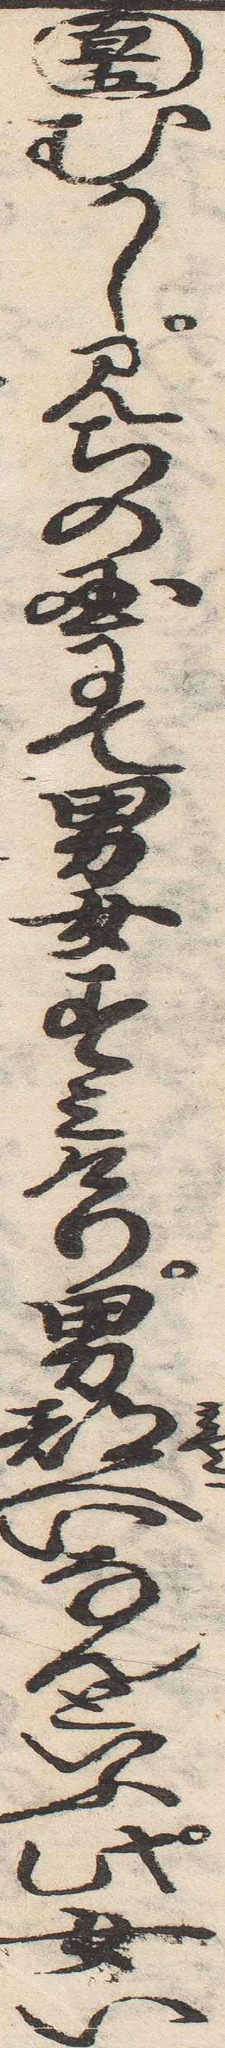百十五むかし。みちの国にて男女すみけり。男都へいなんといふ。此女い
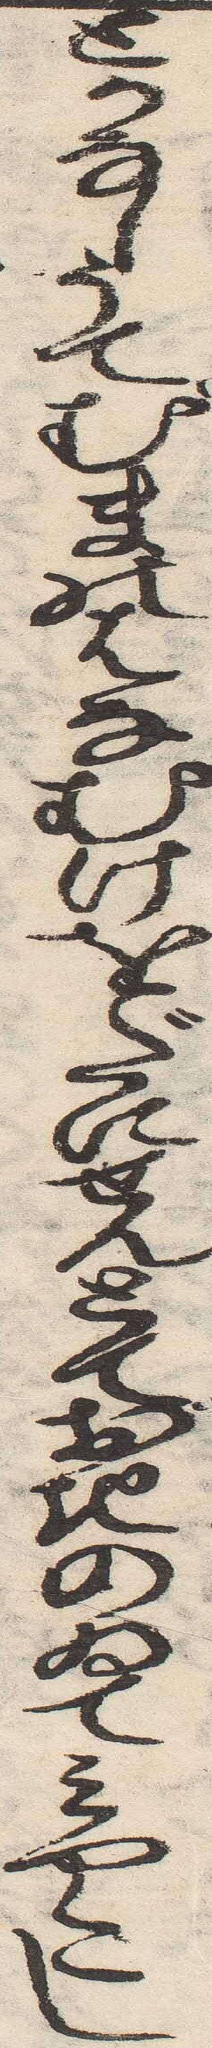とかなしうて。むまのはなむけをだにせんとて。おきのゐてみやこし
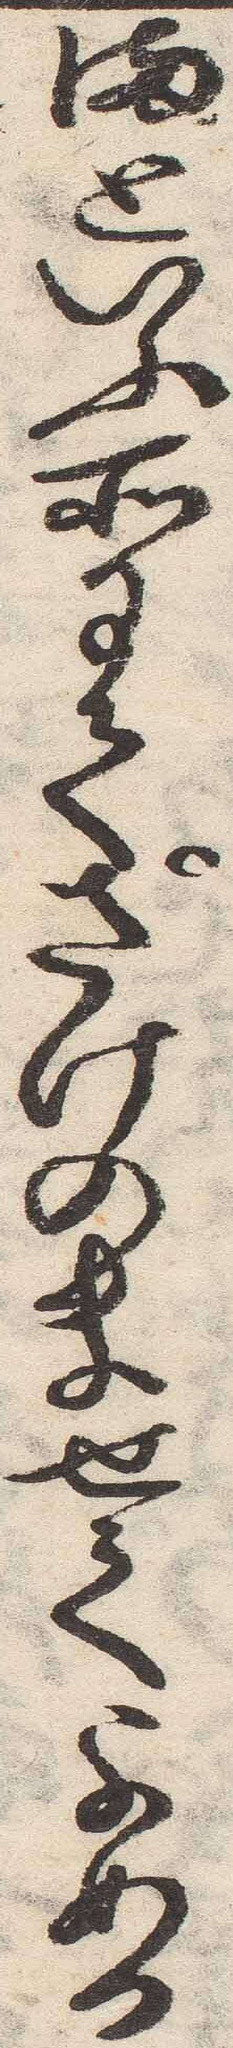まといふ所にて。さけのませてよめる
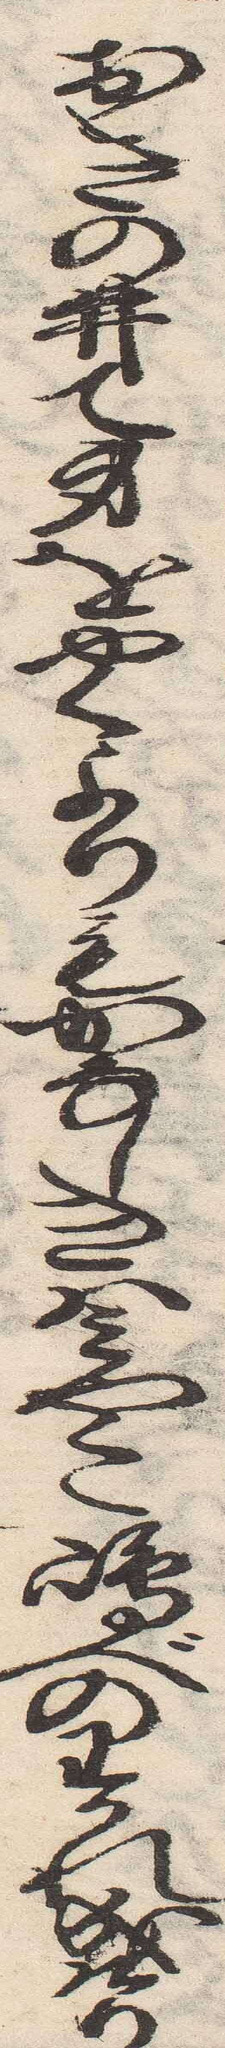古今おきのゐて身をやくよりもかなしきはみやこ島べのわかれ成けり
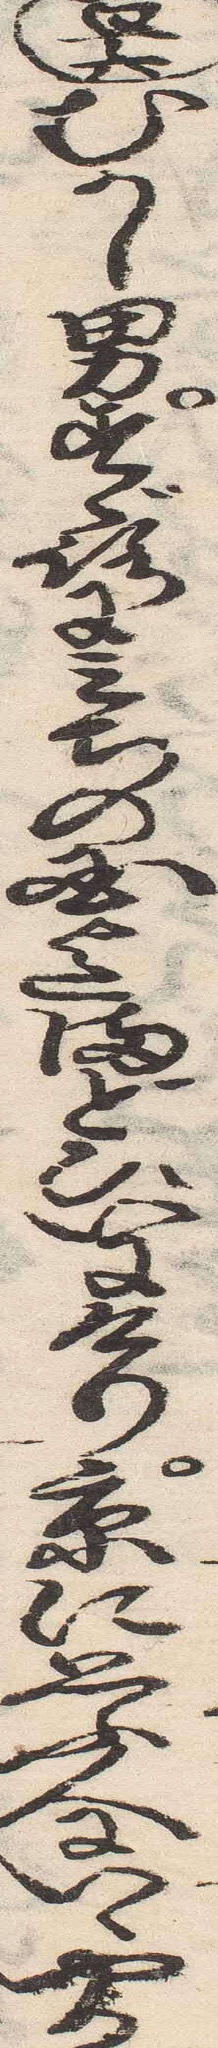百十六むかし男。すゞろにみちの国迄まどひいにけり。京に思ふ人にいゝやる
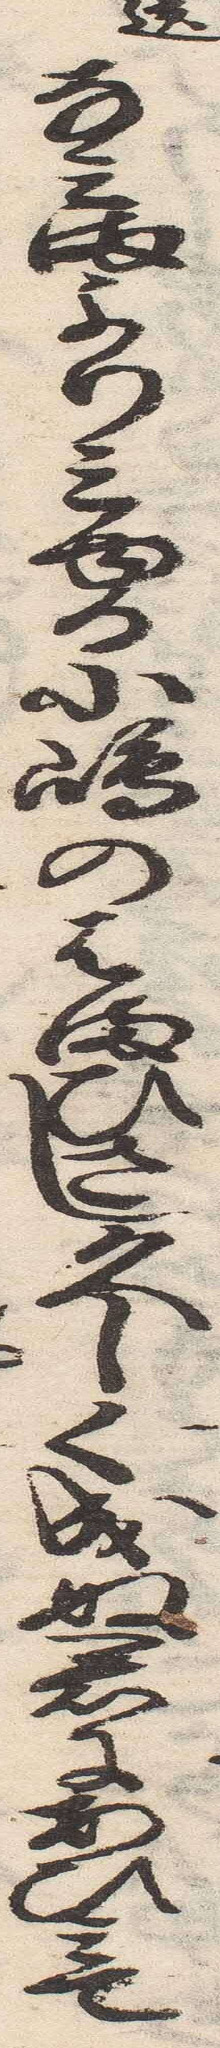拾遺なみまよりみゆる小島のはまひさし久しく成ぬ君にあひみて
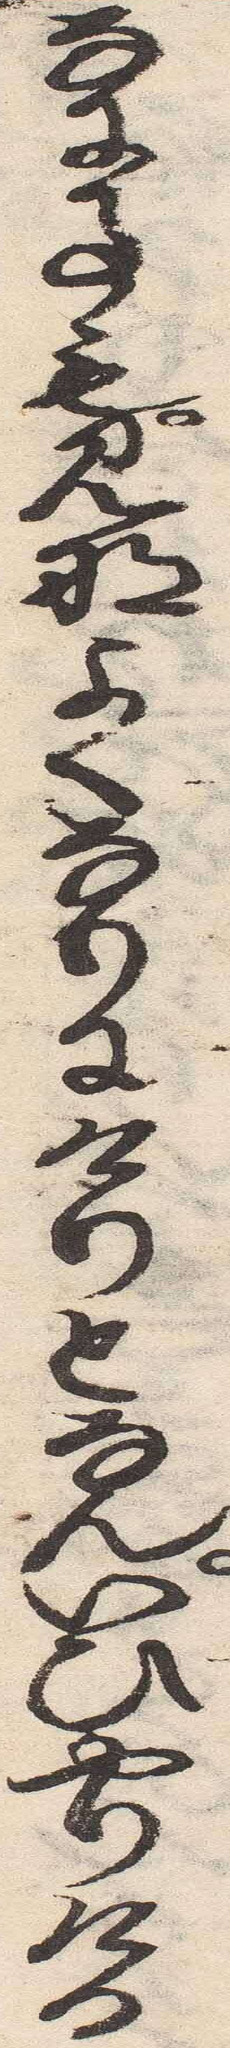なに事も。みなよくなりにけりとなん。いひやりける
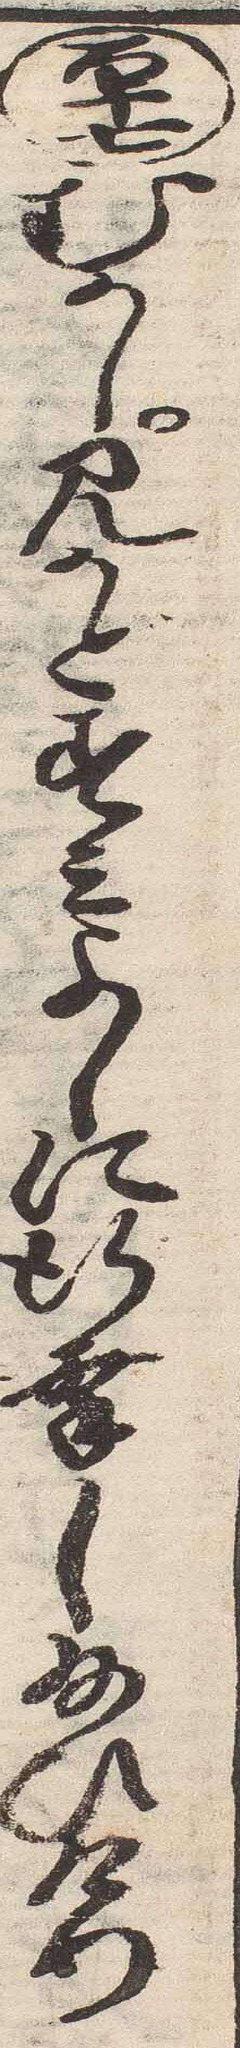百十七むかし。みかとすみよしに行幸し給ひけり
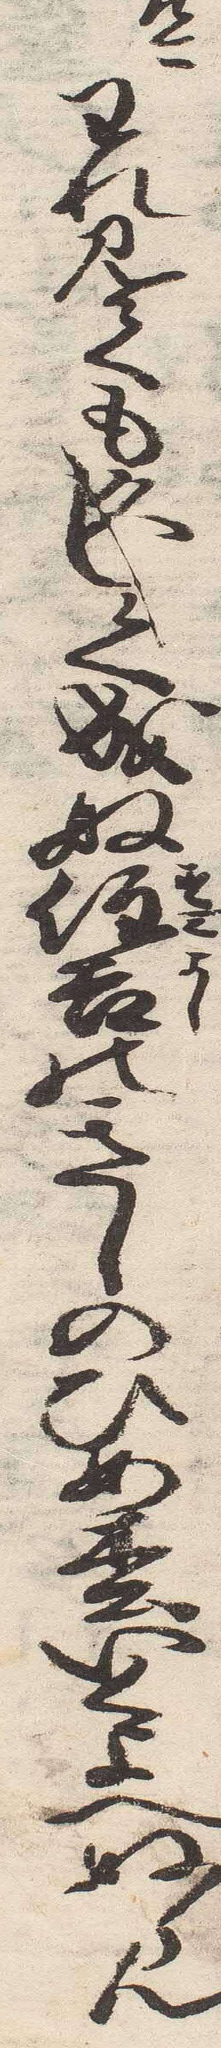古今われ見ても久しく成ぬ住吉のきしのひめ松いくよへぬらん
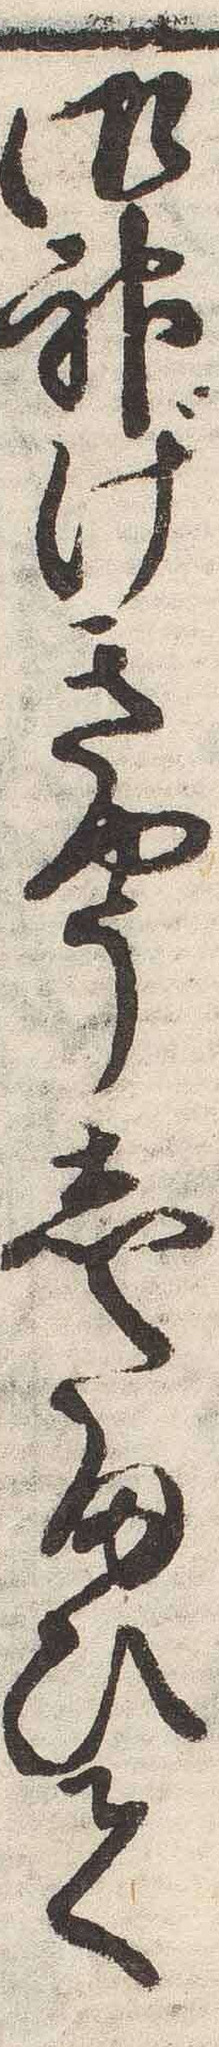御神げきやうしたまひて
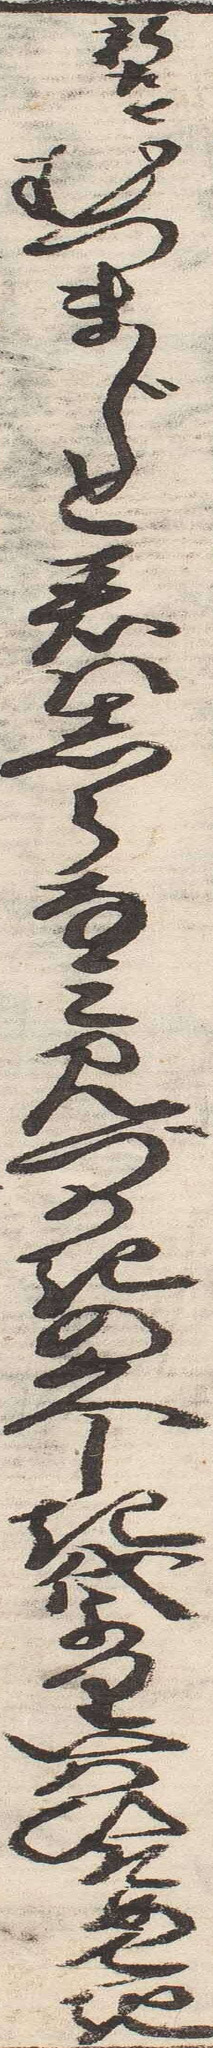新古今むつまじと君はしらなみみづかきの久しき代よりいはひそめてき
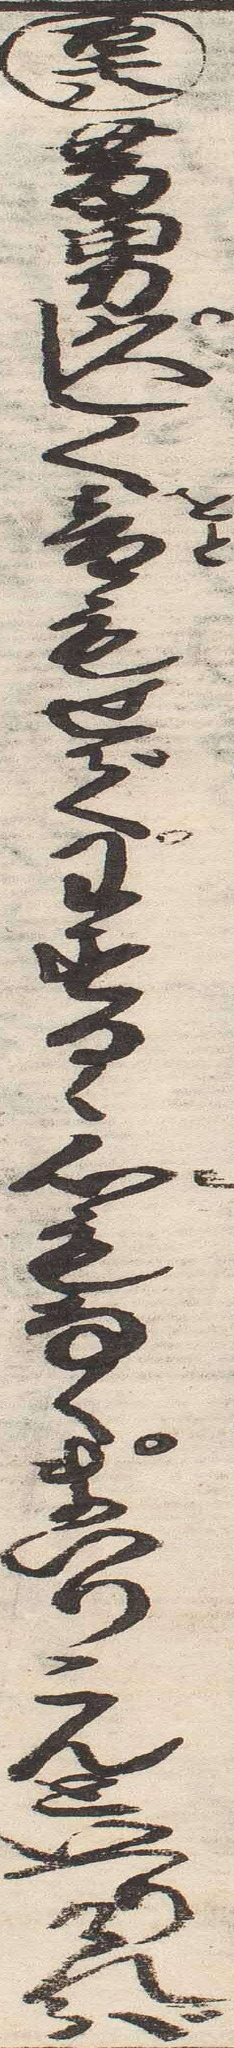百十八昔男。久しく音もせで。わするゝ心もなく。まいりこんといへりければ
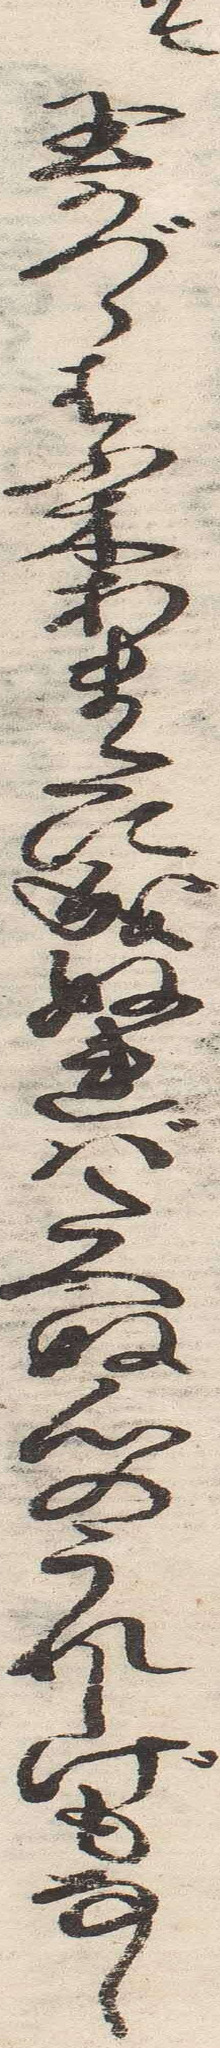古今玉かづらはふ木あまたに成ぬればたへぬ心のうれしげもなし
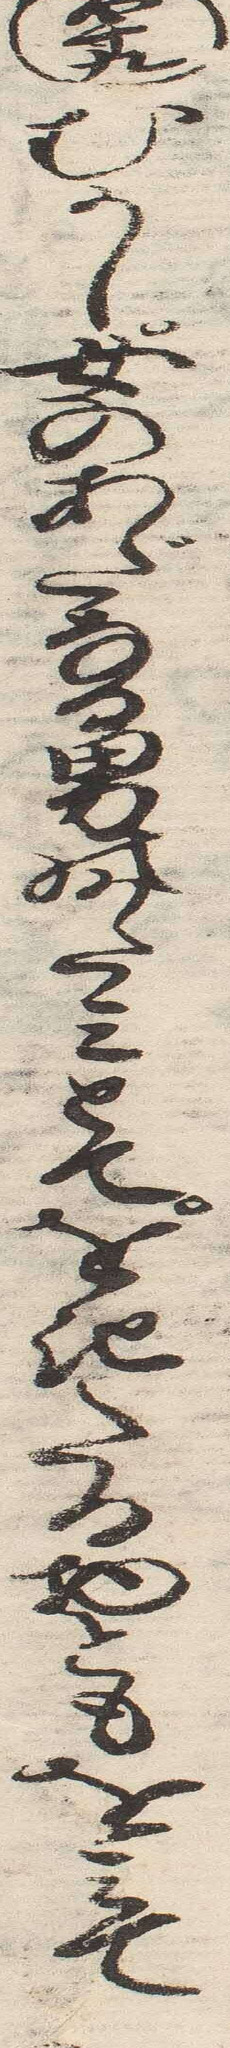百十九むかし。女のあだなる男のかたみとて。をきたる物ともをみて
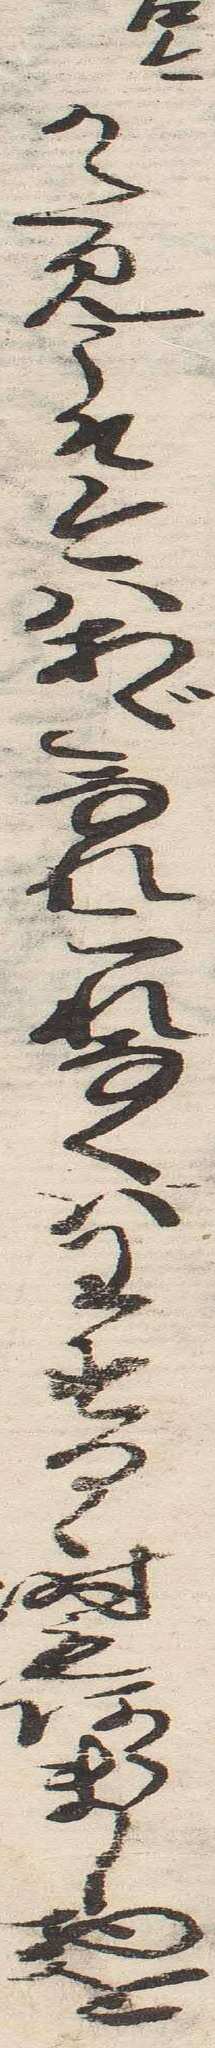古今かたみこそ今はあだなれこれなくばわするゝ時もあらまし物を
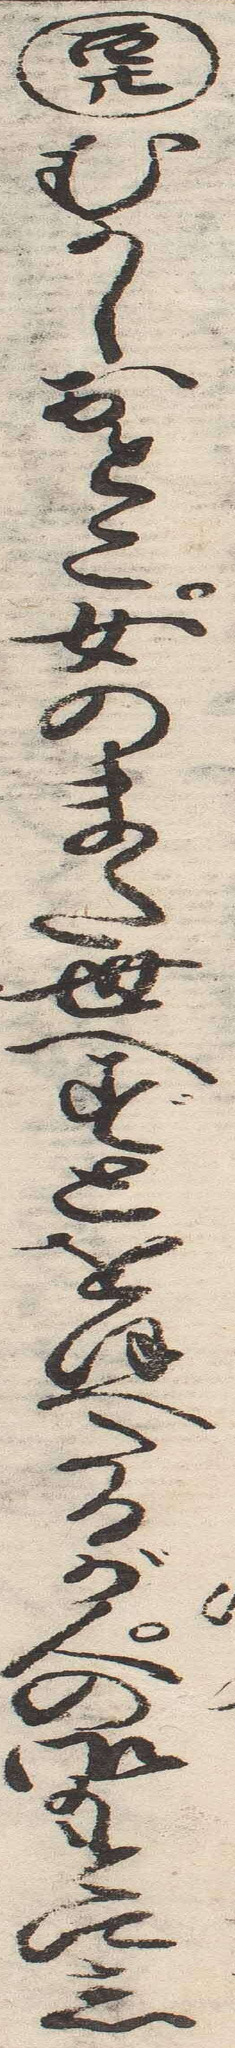百廿むかしおとこ。女のまた世へずとをほへたるが。人の御もとにし
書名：伊勢物語
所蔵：東京学芸大学附属図書館 国文学研究資料館
